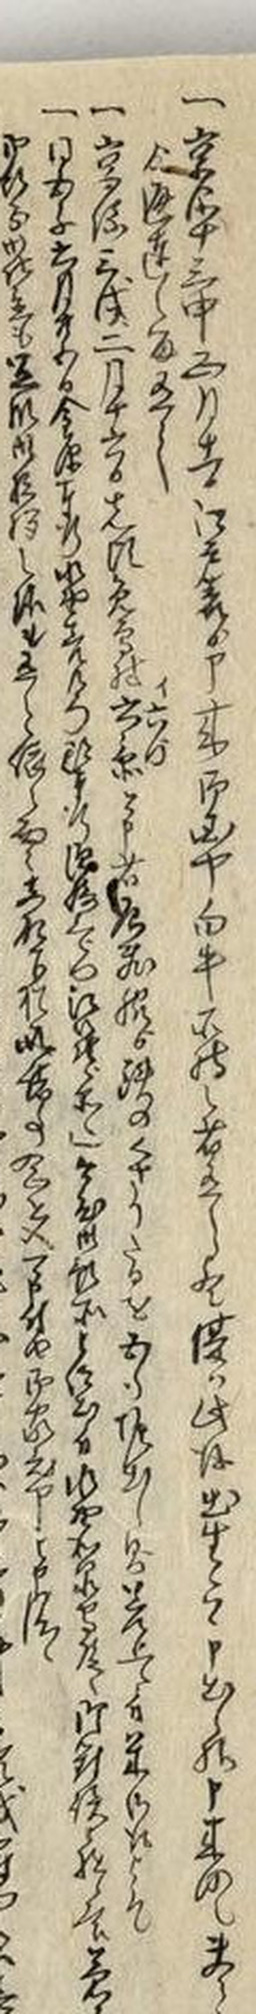一享保三戌二月十六日先頃免鳥村六兵衛と申者屋敷脇ゟ鉄のくさりたるを五ツ堀出し則差上候ニ付米弐俵被下候
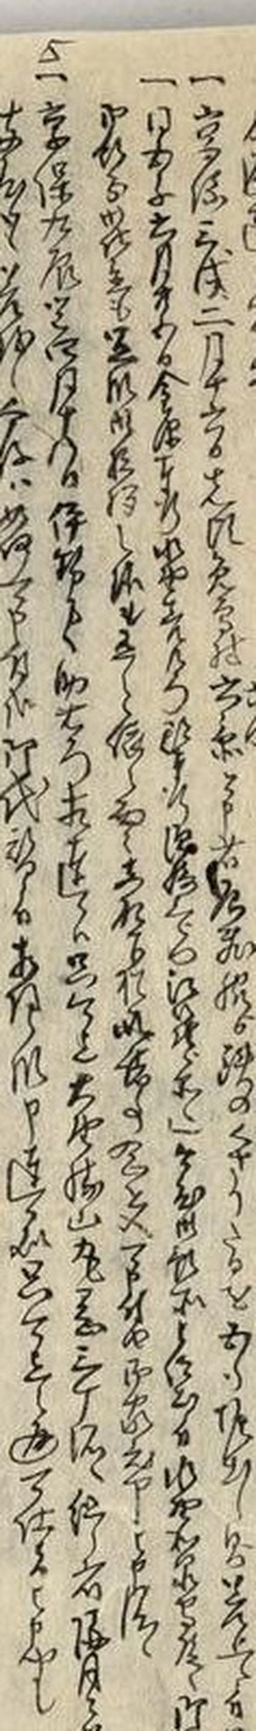御領分御代置も宜段御挨拶之趣も有之候依之面々支配下猶以諸事念を入可申付由御家老中被申渡候
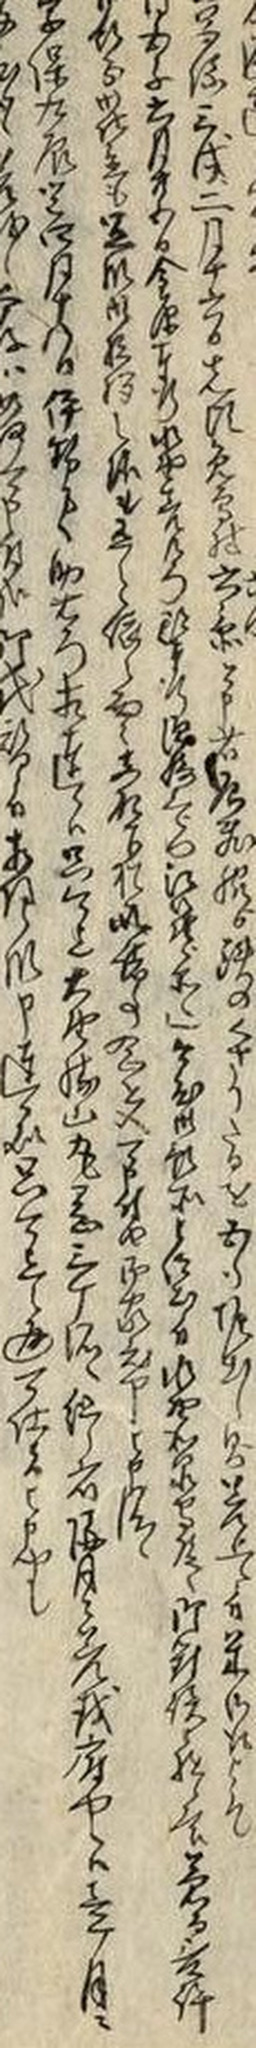御領分御代置も宜段御挨拶之趣も有之候依之面々支配下猶以諸事念を入可申付由御家老中被申渡候
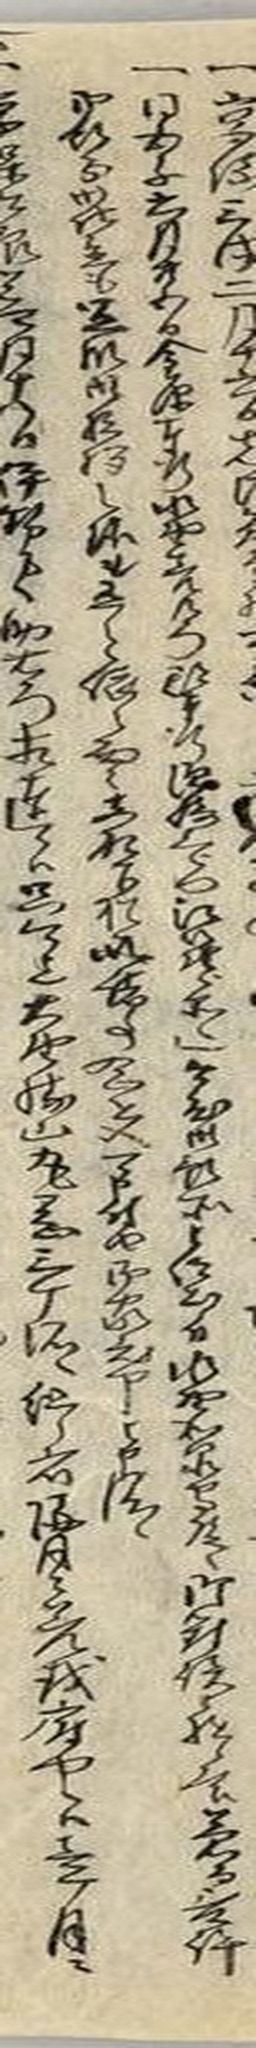△一享保九辰閏四月十八日伊勢方へ助右衛門相達候ハ只今迄大野勝山丸岡三ケ所へ組之者隔月ニ差越府中ヘハ壱ケ月ニ
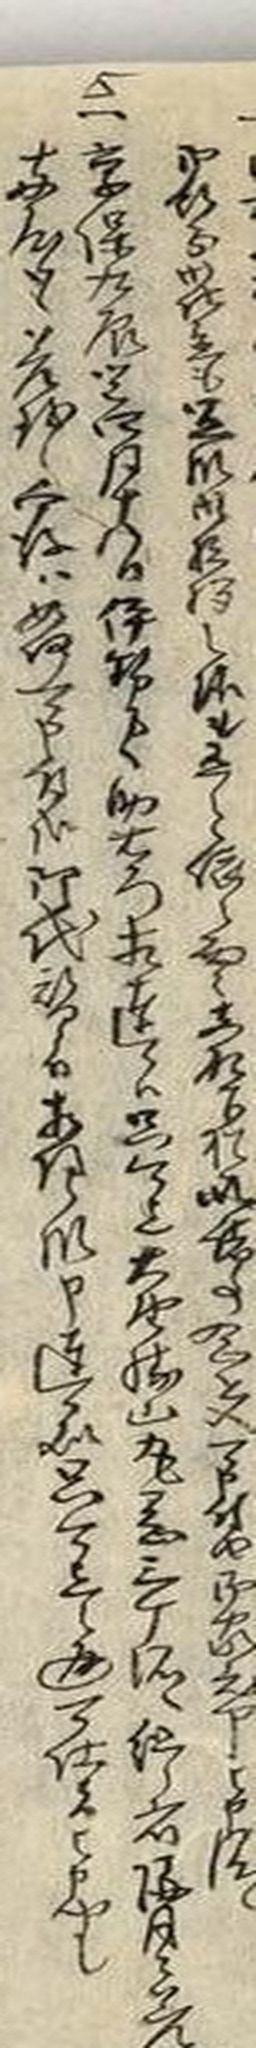両度ツヽ差越候向後ハ如何可申付哉御代替ニ付相伺候段申達候処只今迄之通可仕旨被申聞候
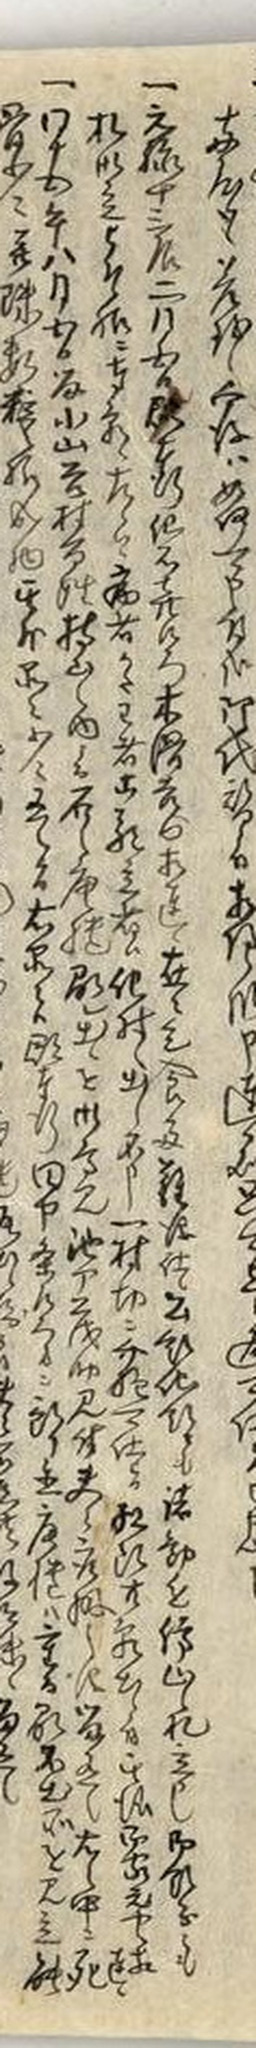札御立被下候様ニ奉願候左候ハヽ病者かたわ者等難立者ハ他村へ出し不申一村切ニ介抱可仕旨組頭共願出候ニ付其趣御家老中へ相達候
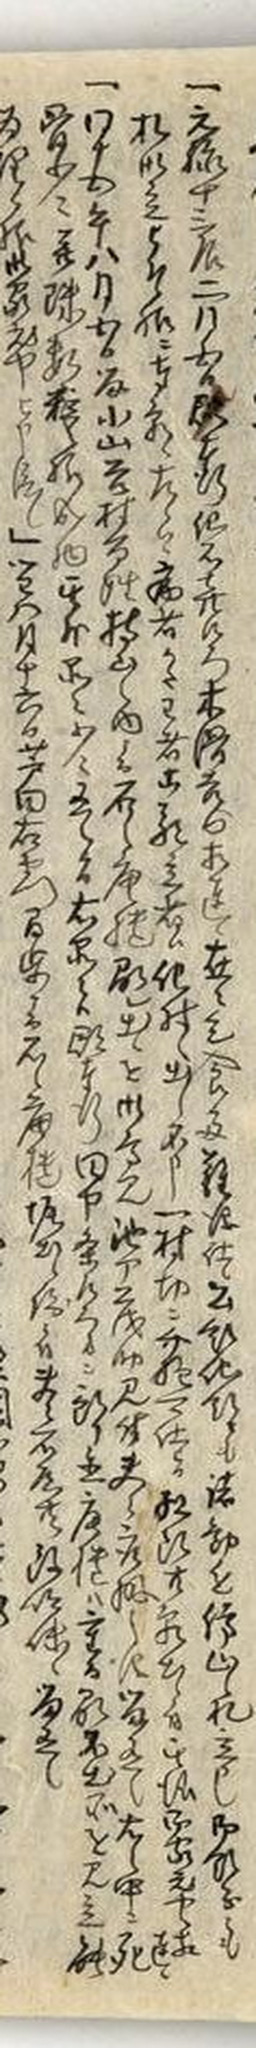一同十五午八月五日留小山谷村百姓持山之内ニ而石之唐櫃顕レ出候を御鳥見池部茂助見付夫々取扱之儀留有之右之中ニ死
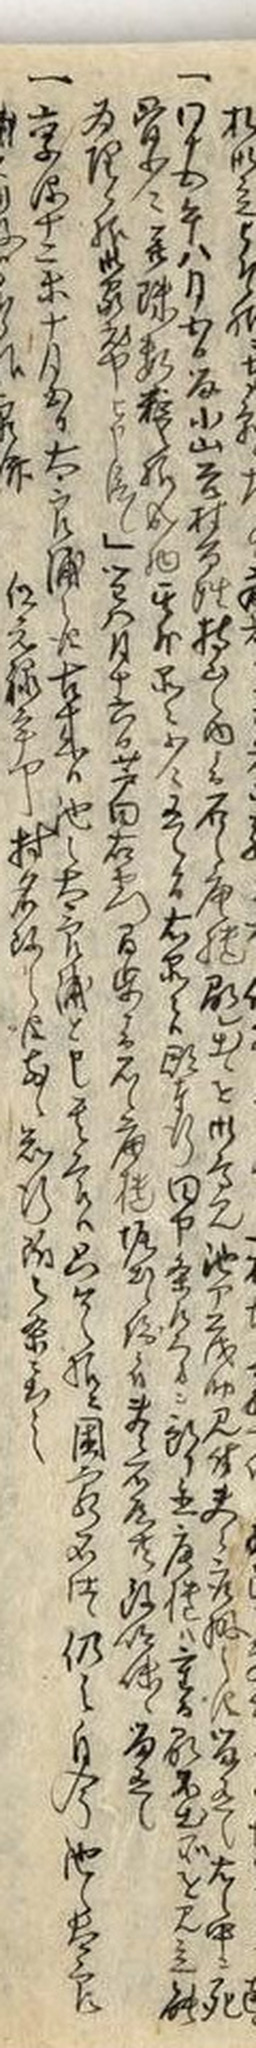為埋候様御家老中被申渡候」閏八月十六日芦田右衛門間歩ニ而石之唐櫃堀出候儀ニ付夫々石屋共致吟味候留有之
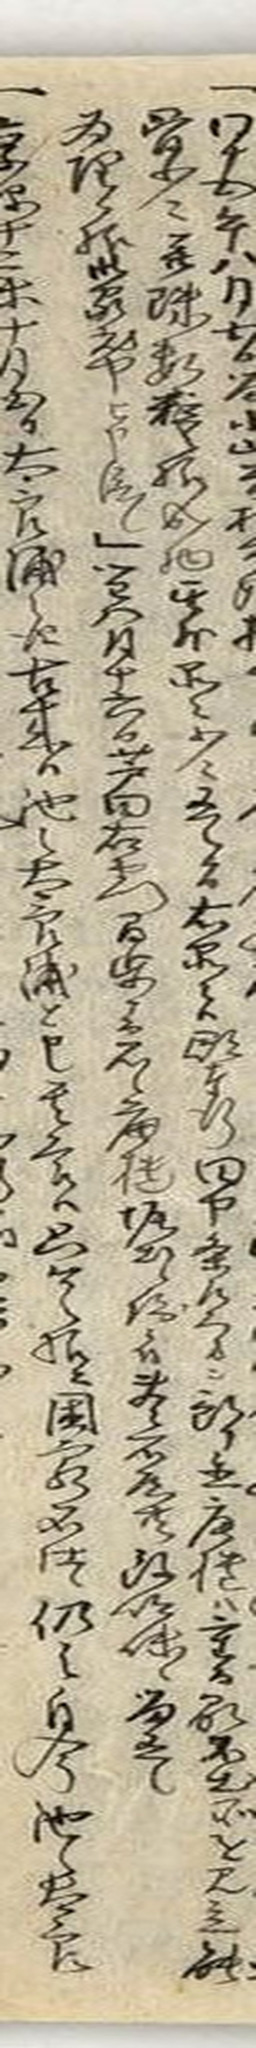一享保十二未十月五日太良浦之儀古来ハ池之太良浦と申其節ハ只今之様ニ困窮不仕候仍之自今池之太良
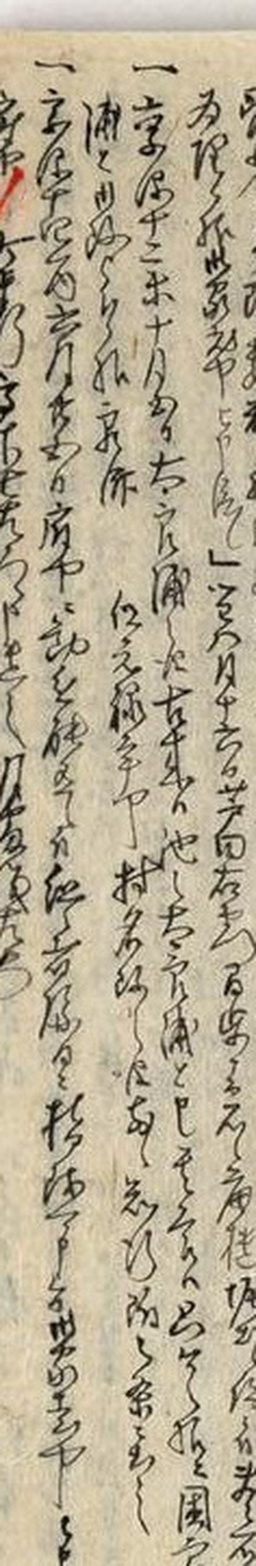浦と御改被下候様願済但元禄年中村名改之儀前之知行附之条ニ出之
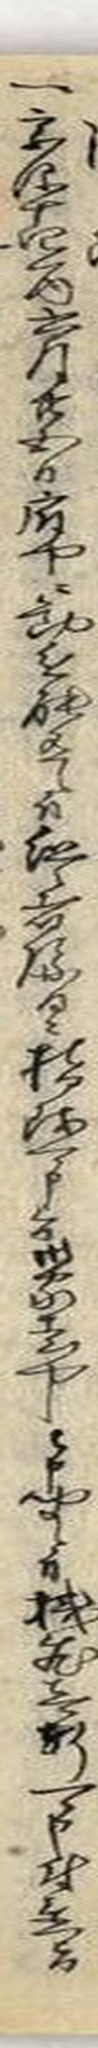一享保十四酉六月廿五日府中ニ勧進能有之ニ付組之者隔日ニ指越可申旨御家老中被申聞候ニ付桟敷壱軒可申付置旨
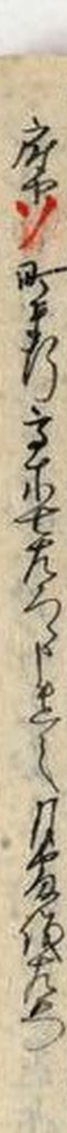府中町奉行高木七左衛門へ申遣之月番儀左衛門

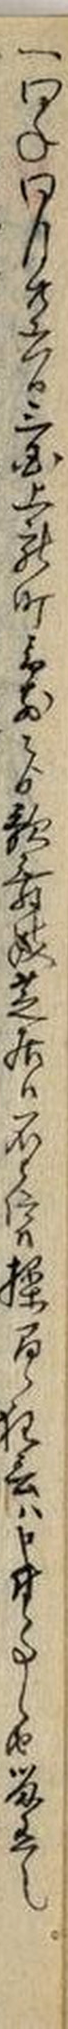一同年同月廿六日三国上新町ニ而前々ゟ歌舞妓芝居ハ不被仰付操間之狂言ハ申付候事之由留有之
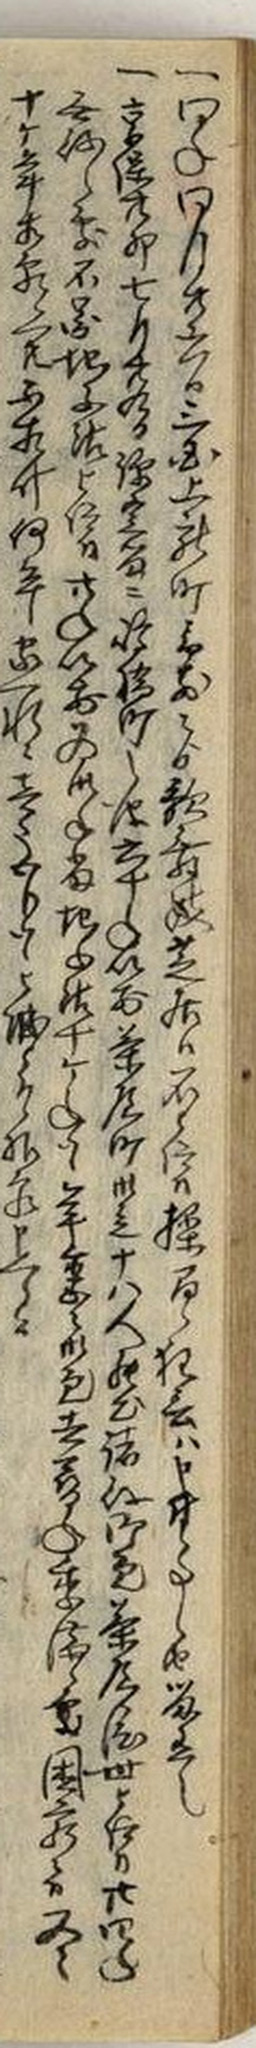一享保廿卯七月廿九日評定留ニ嶋橋町之儀六十年以前茶屋町御立十八人罷出諸役御免茶屋渡世被仰付廿四年
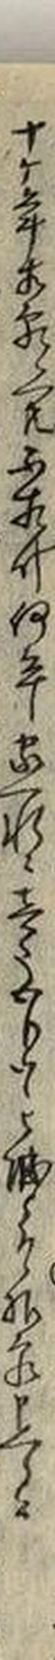十ケ年相願候へ共不相叶何卒家一軒ニ壱匁五歩ツヽ被減被下候様願申上候旨
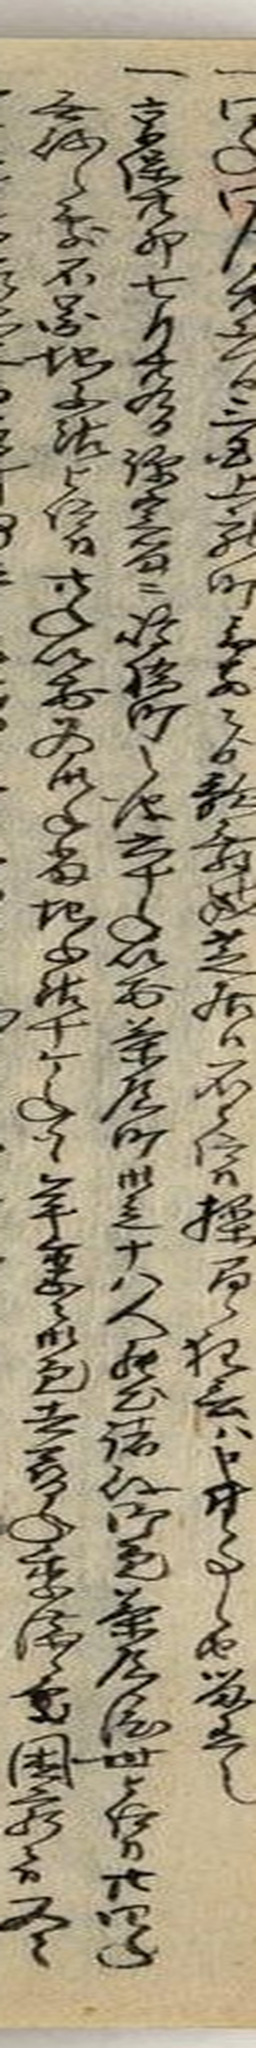無役之処不図地子銀被仰付廿年以前為御手当地子銀十ケ年ツヽ年季ニ御免去暮年季済候処困窮ニ付又々
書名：御国他国諸事之部
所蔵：福井県文書館 Fukui Prefectural Archives
